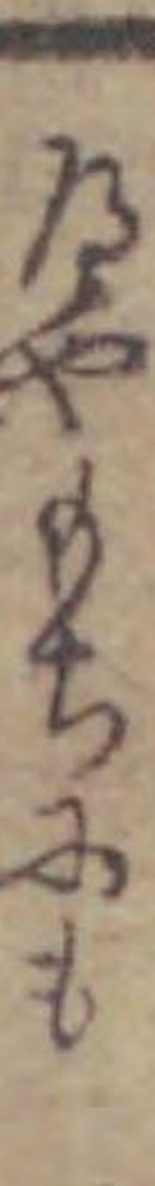へやもちにも
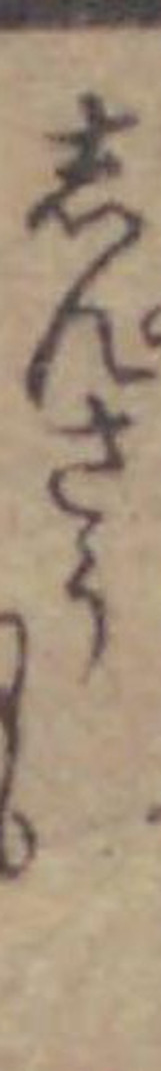しんさうにも
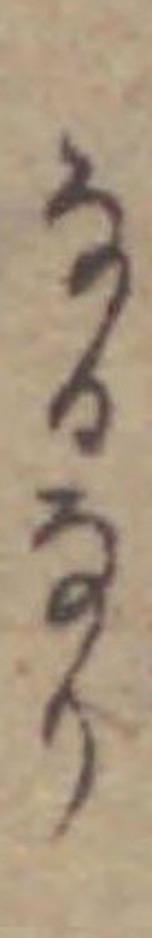なるなり
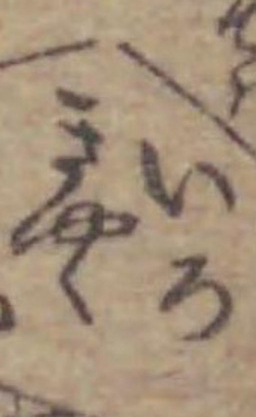ちやく
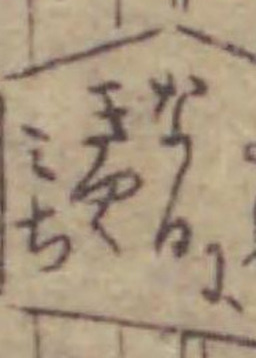ちやく

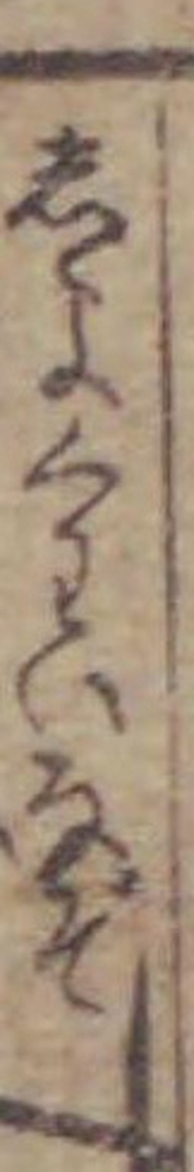しよくわいなぞ
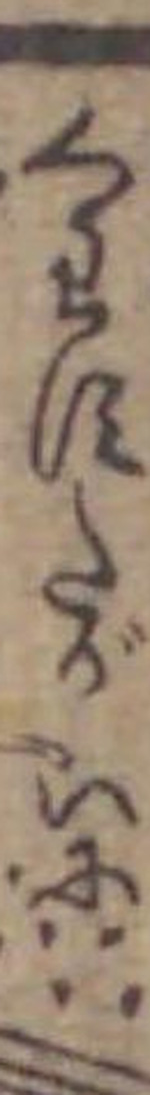くわすたがいに
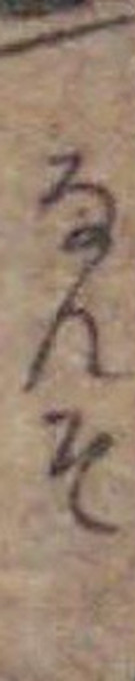なんそ

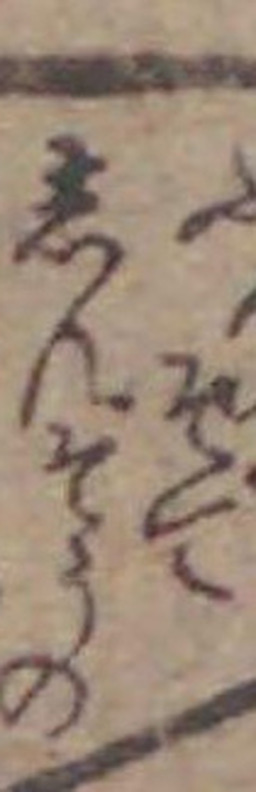しんそうの
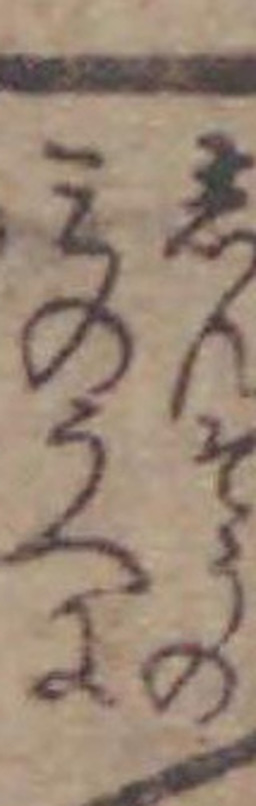みのうへに
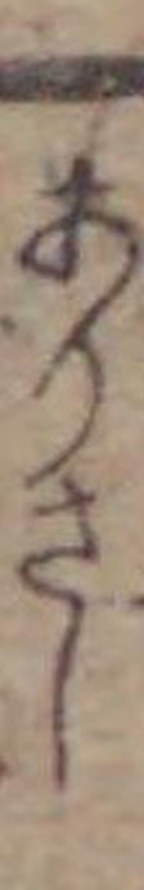ありさし
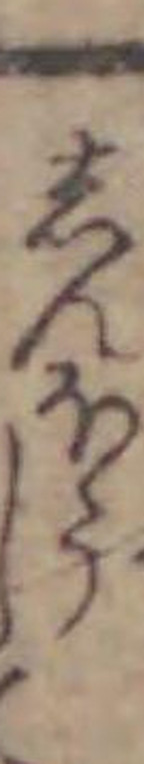しんほう
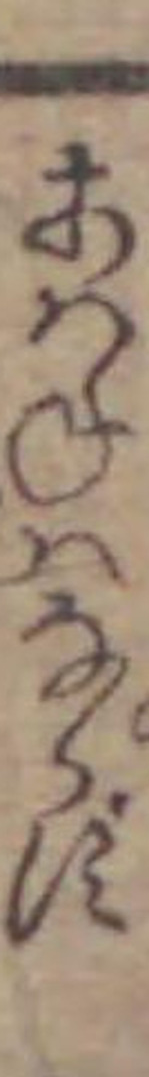あはねはならず
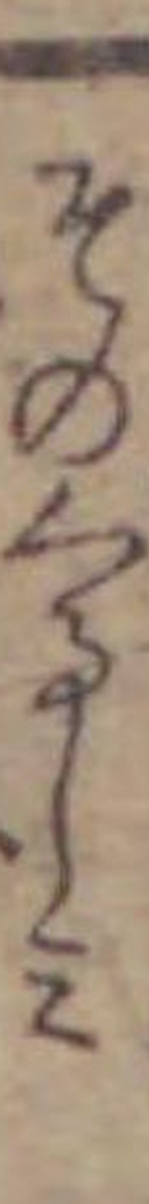そのくるしみ
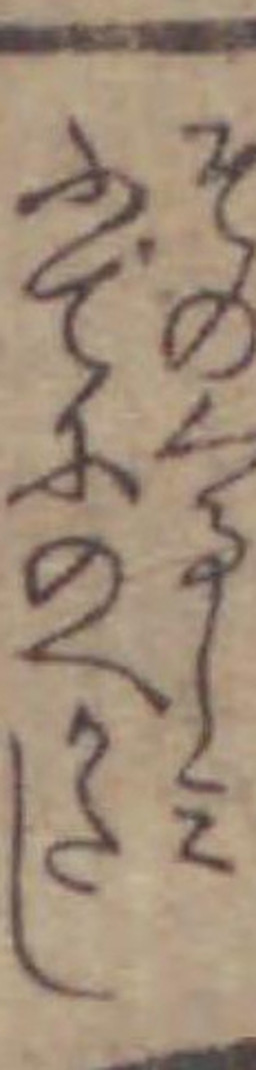ふでにのへかたし
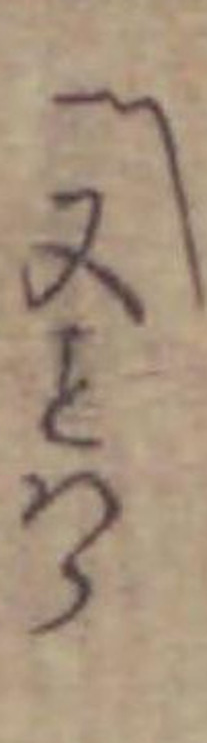「又ことはら
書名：九替十年色地獄 : 3巻
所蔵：国立国会図書館 National Diet Library, JAPAN
